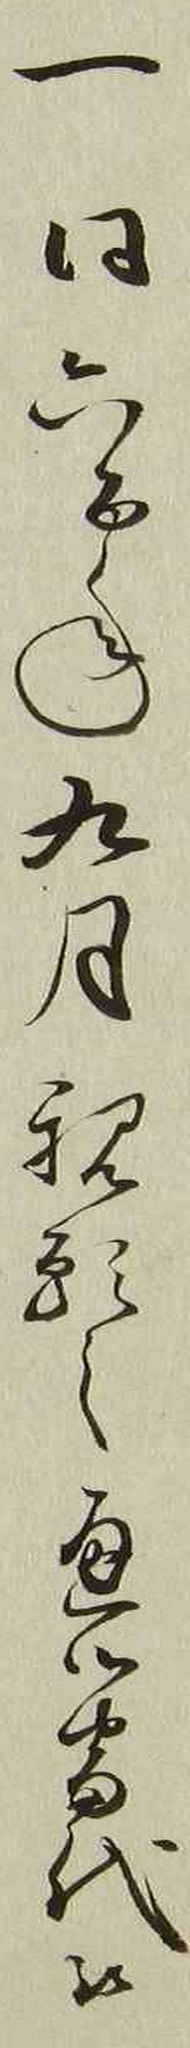一同六酉年九月親願い之通り御番代
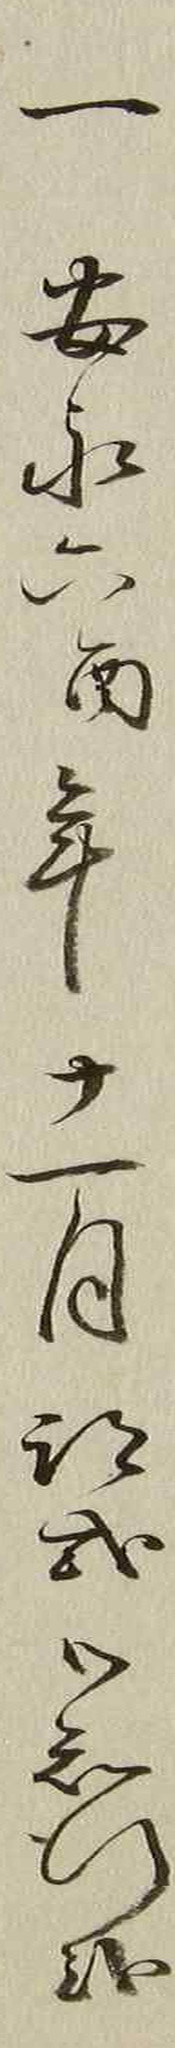一安永六酉年十一月跡式御知行弐
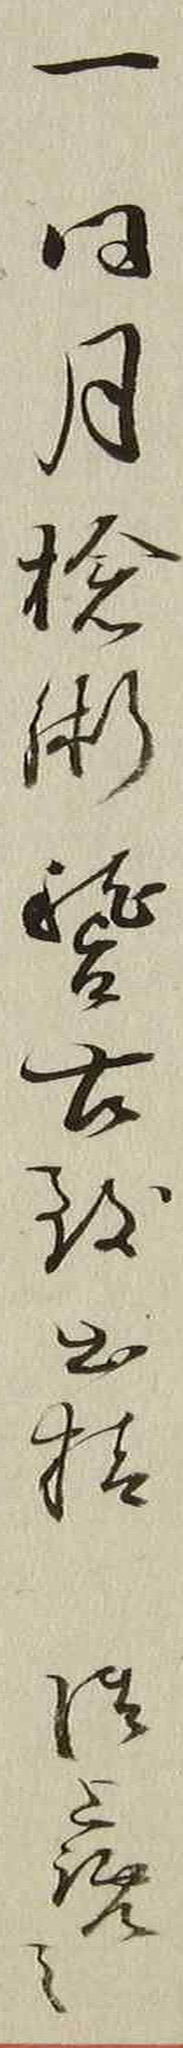一同月槍術稽古出精致し御上覧之
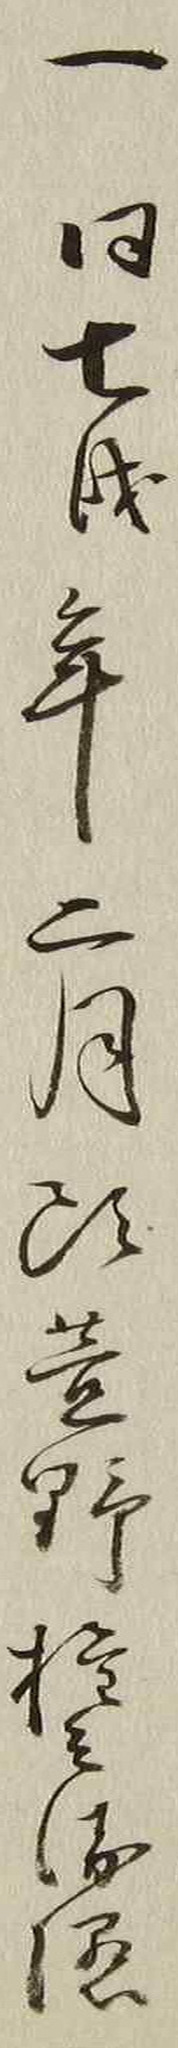一同七戌年二月頭萱野権兵衛隠
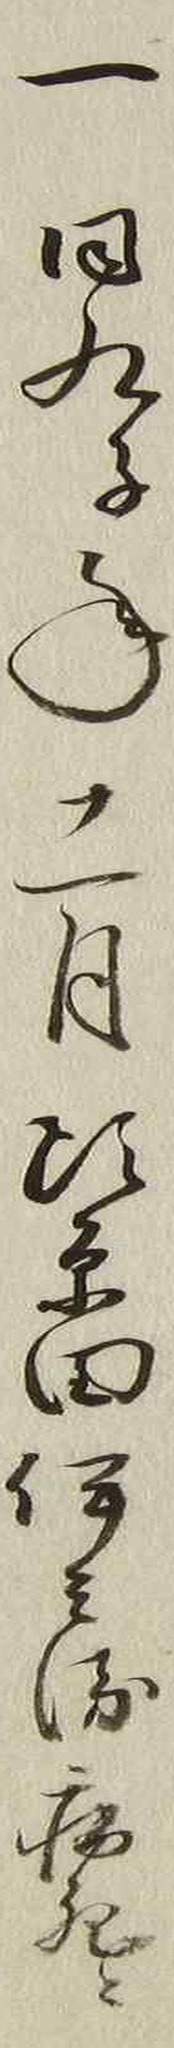一同九子年十一月頭原田伊兵衛病死ニ
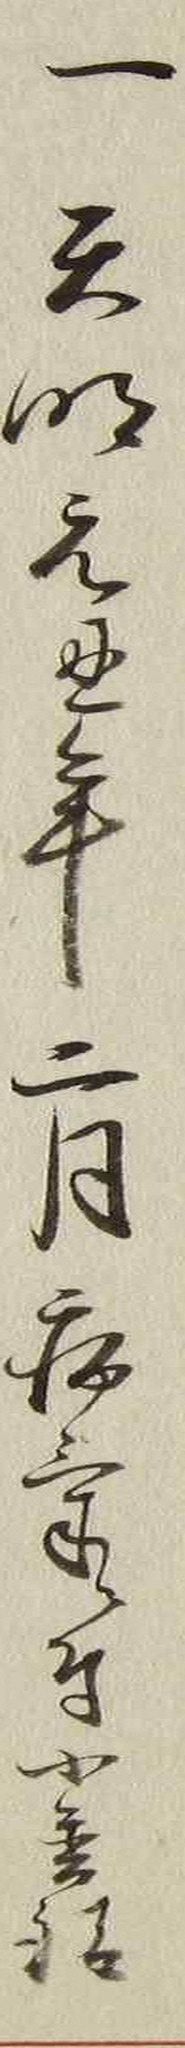一天明元丑年二月病気ニ付き小普請
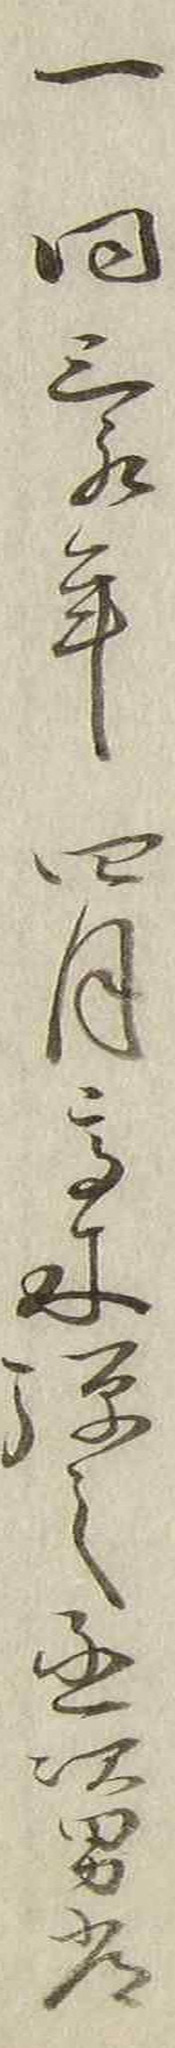一同三卯年四月高木源之丞次男常

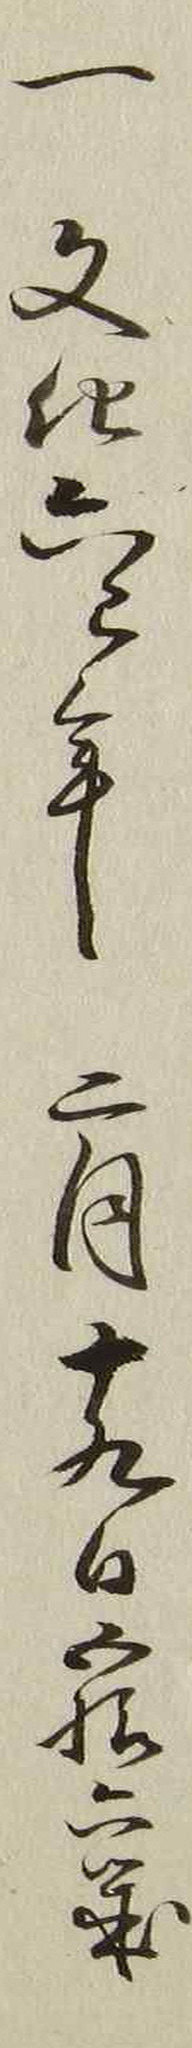一文化六巳年二月十九日五拾六歳
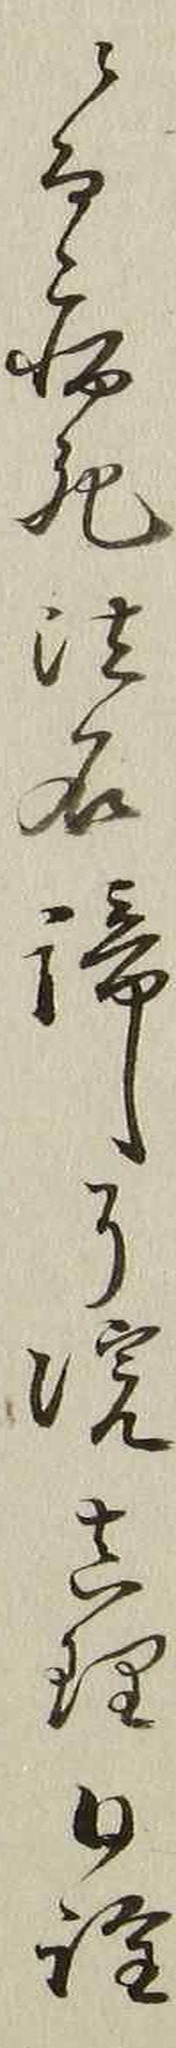ニて病死法名諦了院真理日詮
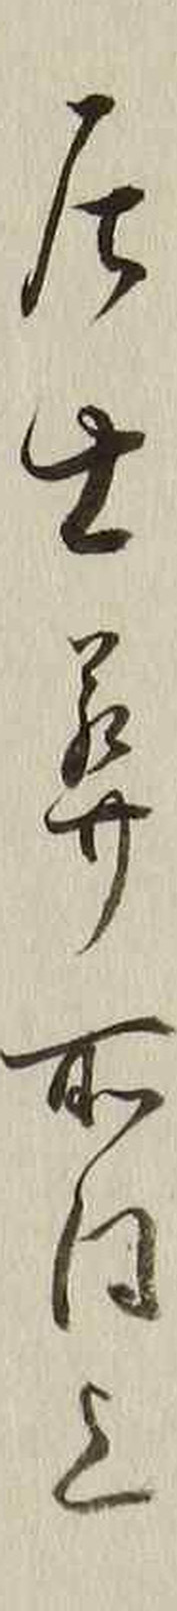居士葬所同上
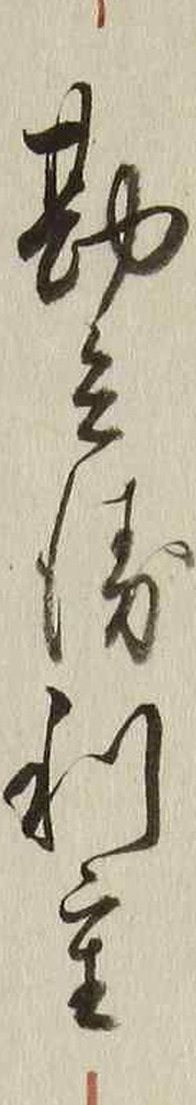勘兵衛利重
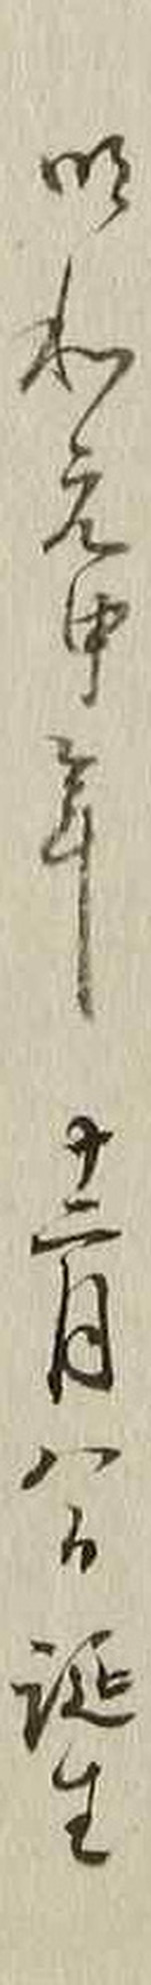明和元申年十二月八日誕生
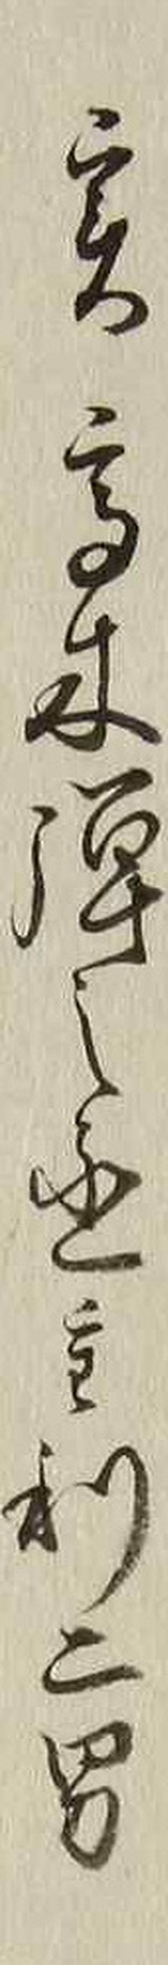実高木弾之丞重利二男
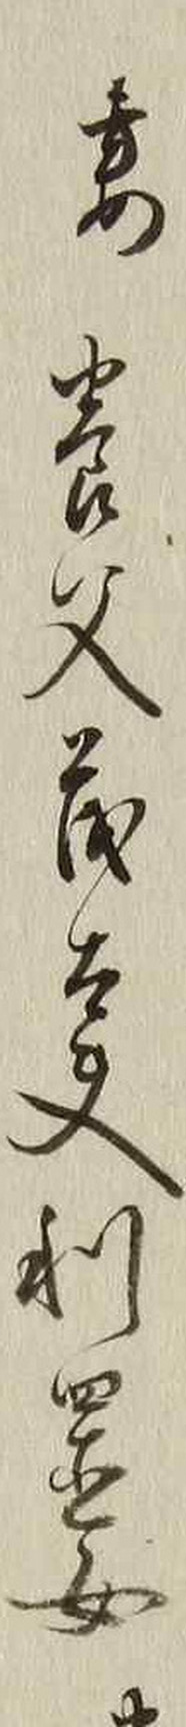妻養父茂太夫利置女
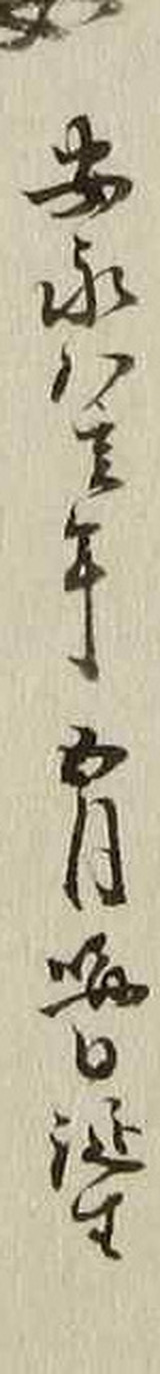安永八亥年五月晦日誕生
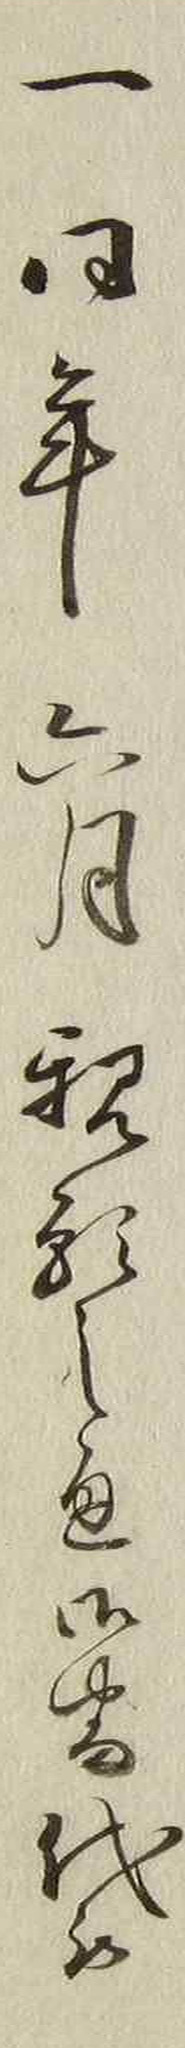一同年六月親願い之通り御番代
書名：諸士系譜　巻之20　い之部20
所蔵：会津若松市立会津図書館
